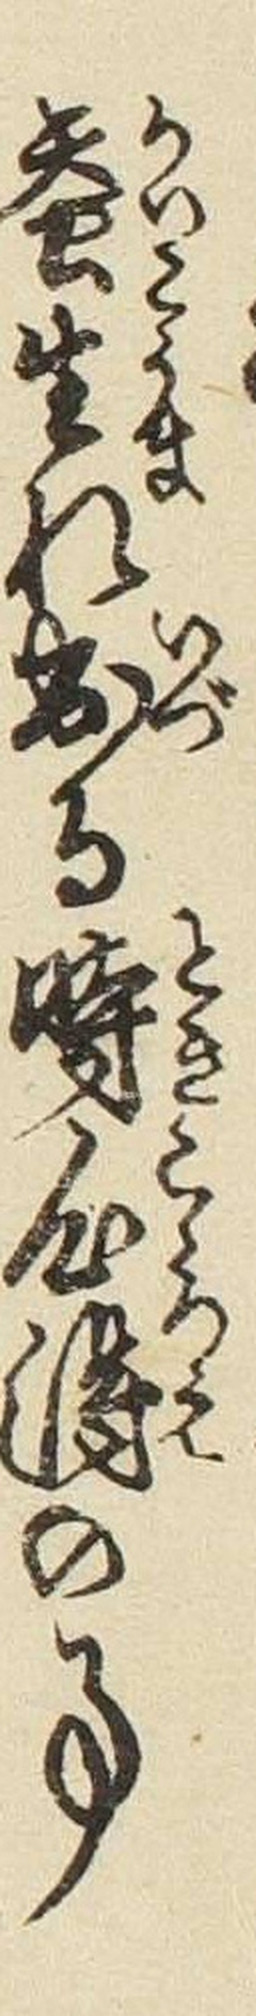蚕生れ出る時心得の事
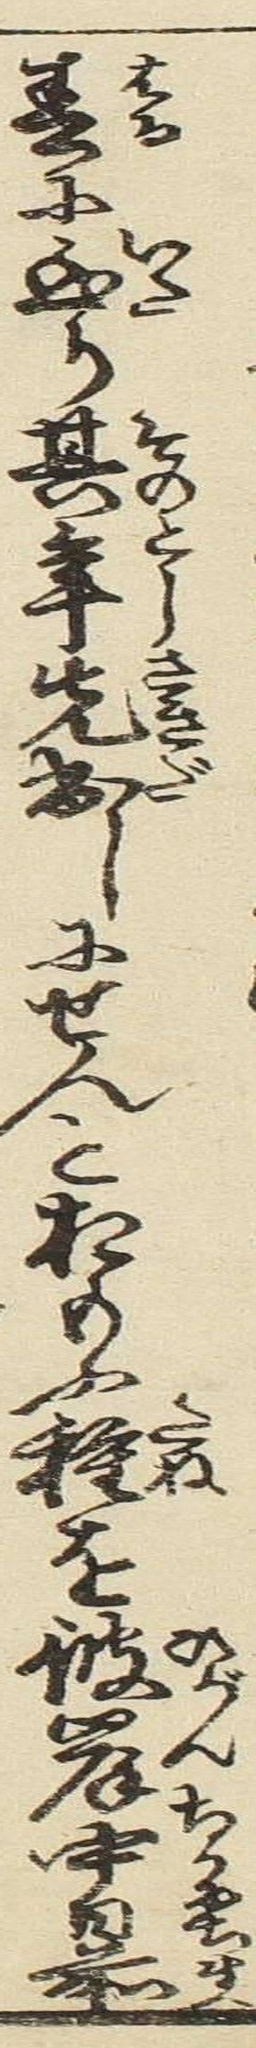春に至り其年先出しにせんとおもふ種を彼岸中日前
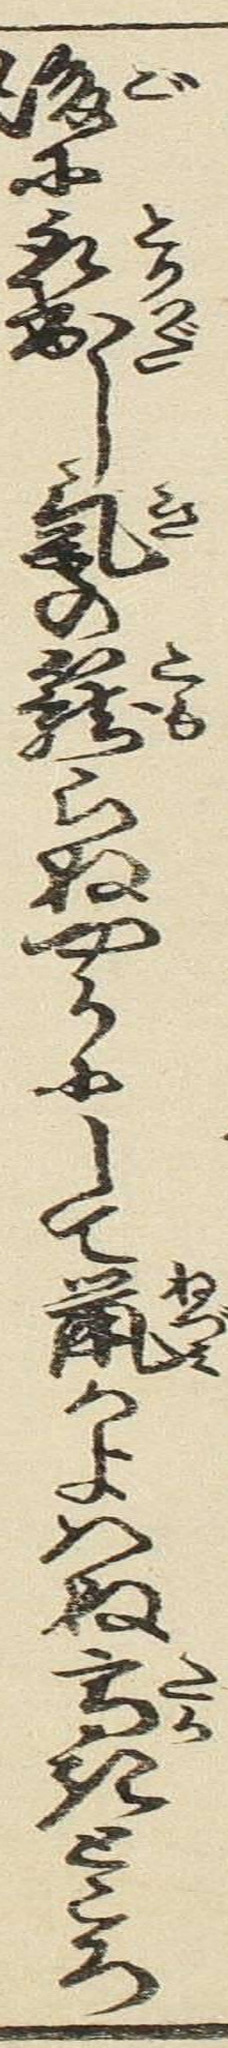後に取出し気の籠らぬやうにして鼠かよはぬ高きところ
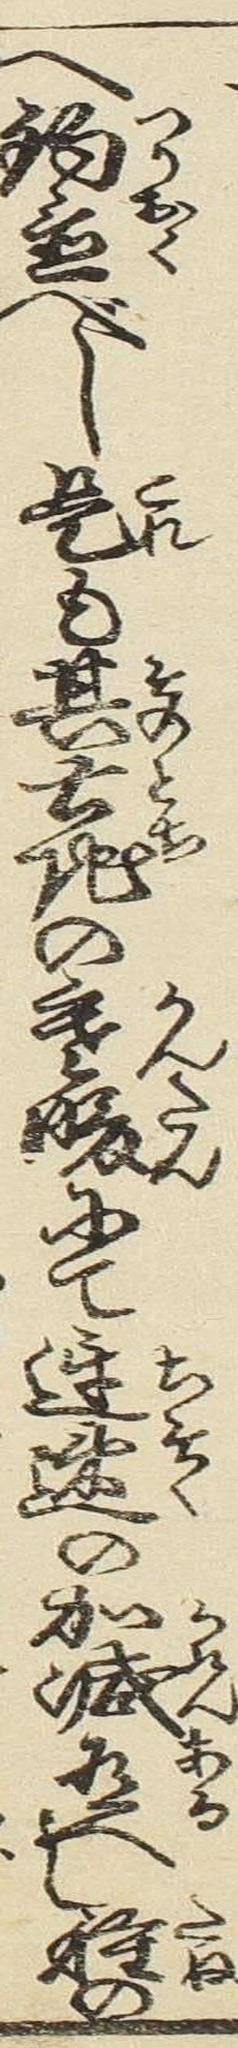へ釣置べし是も其土地の寒暖にて遅速の加減有へし種の
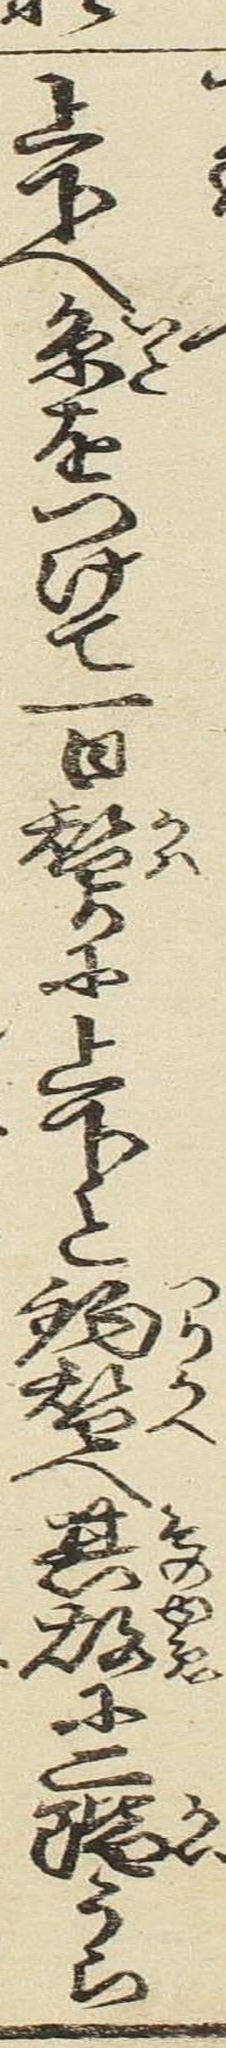上下へ糸をつけて一日替りに上下と釣替へ其故に二階うら
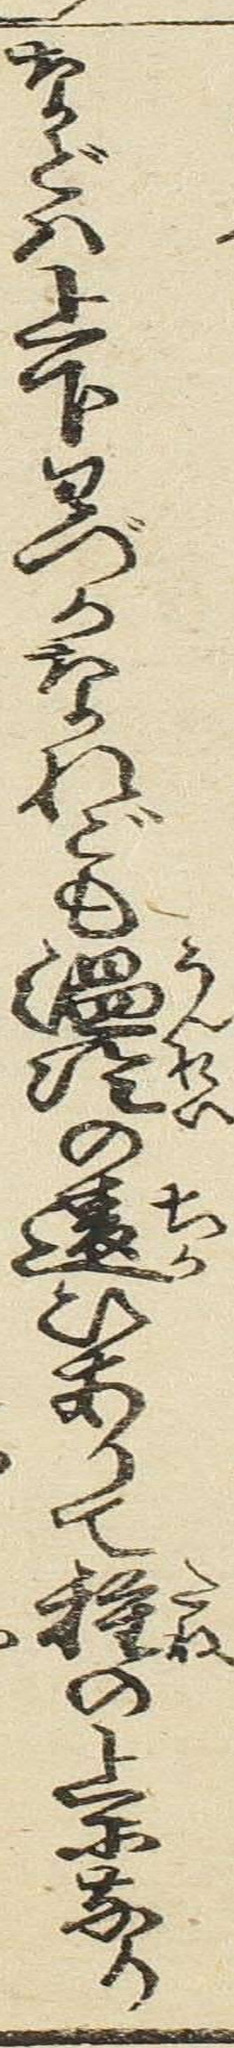などは上下わづかなれども温冷の違ひありて種の上になり
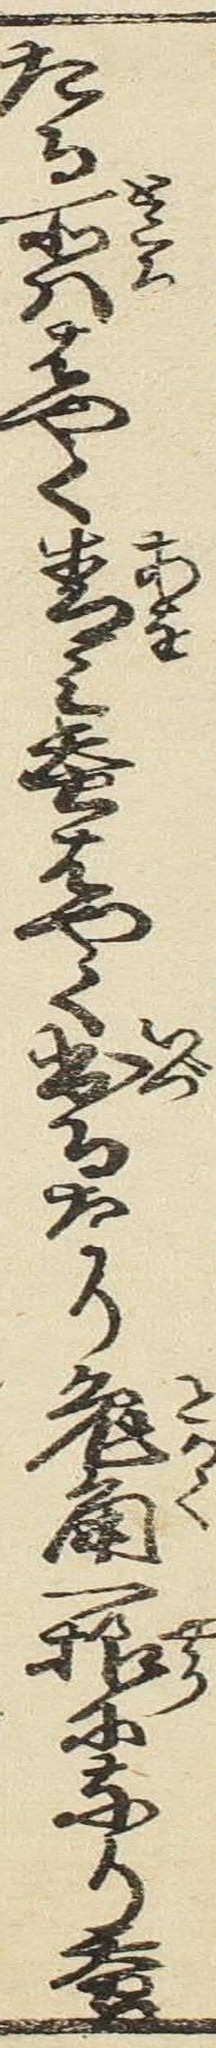たる所ははやく青み蚕はやく出るなり兎角一様になり蚕
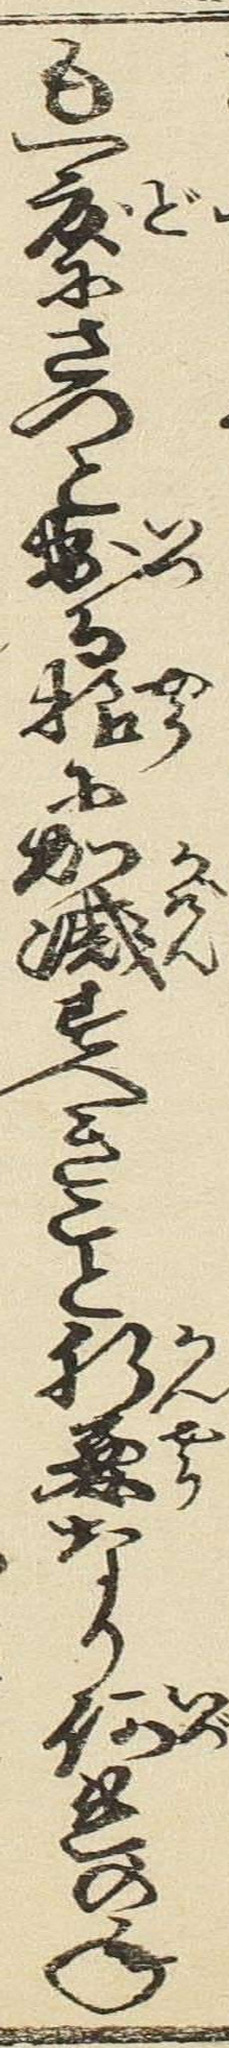も一度にさつと出る様に加減すへきこと肝要なり何れの年
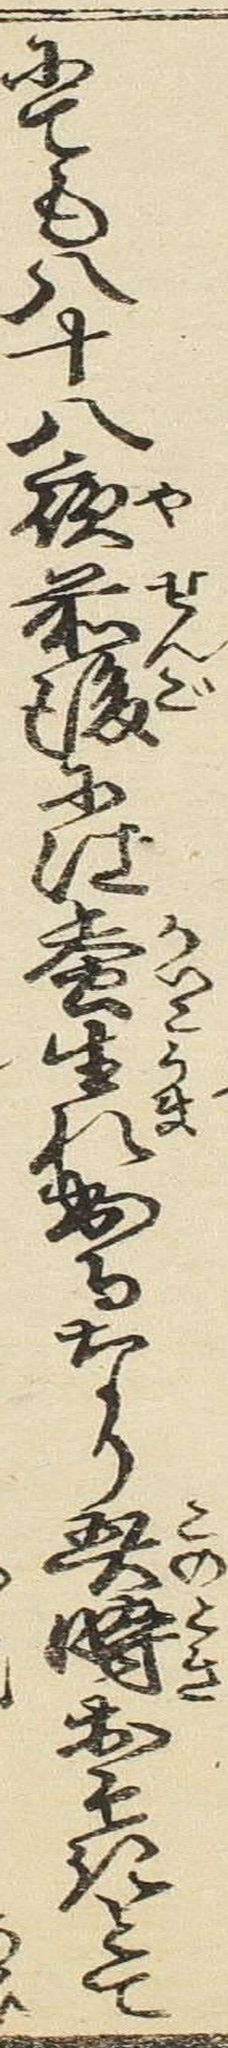にても八十八夜前後には蚕生れ出るなり此時おそきとて
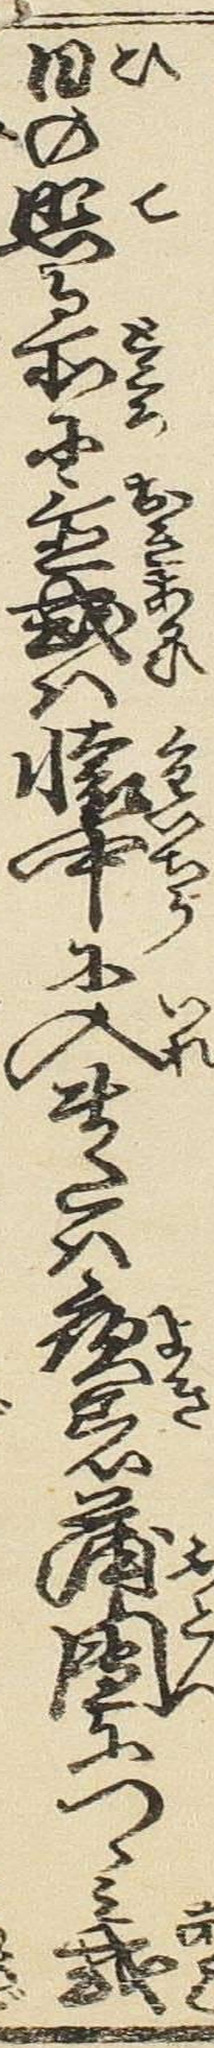日の照る所に置或は懐中に入または夜着蒲団につゝみ或
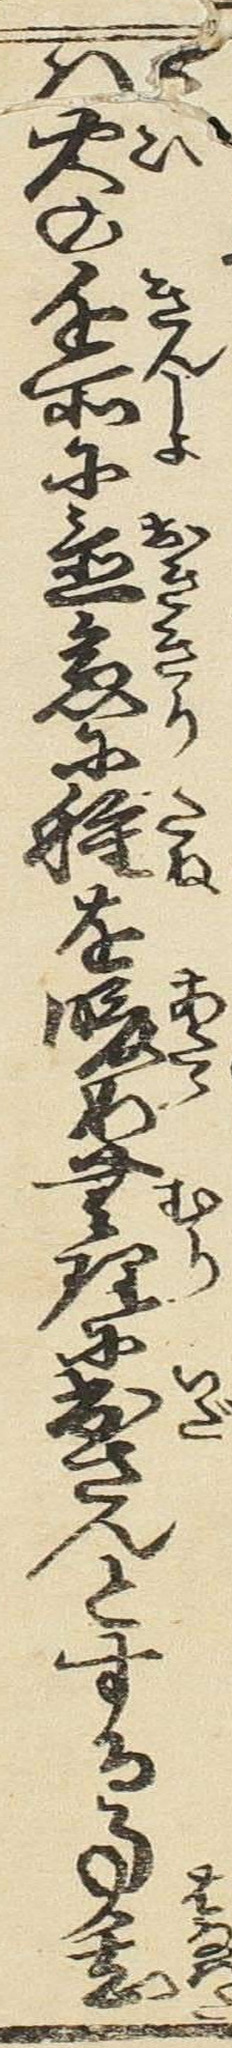は火の近所に置急に種を暖め無理に出さんとする事甚
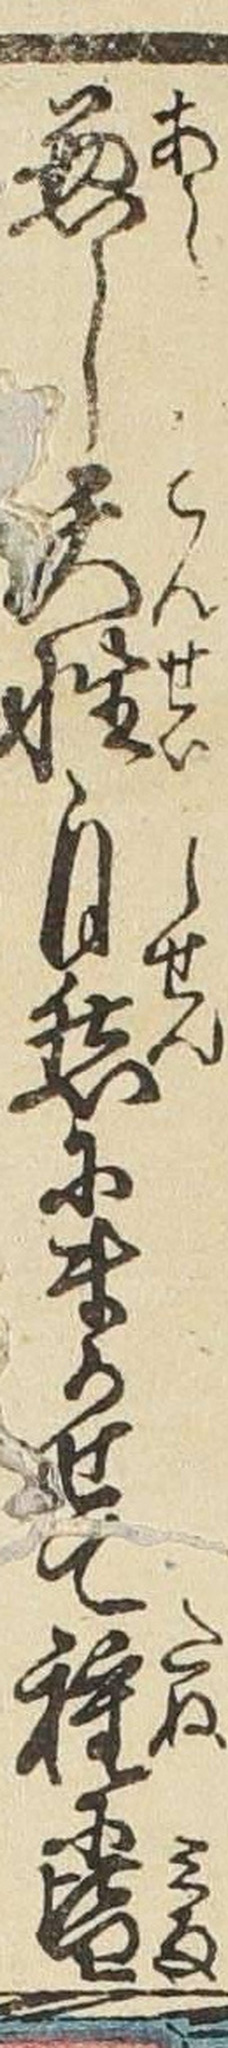悪し天性自然にまかせて種に皆
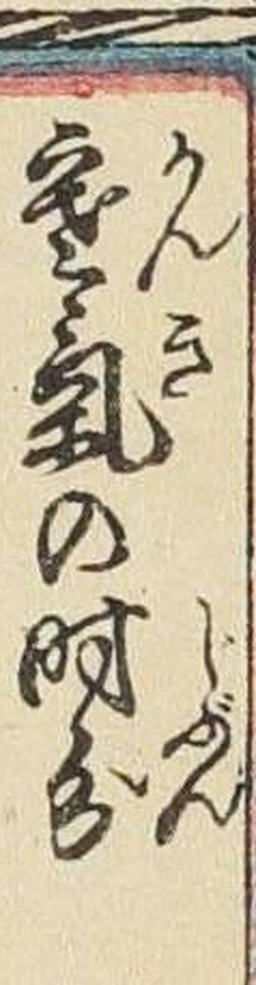寒気の時分
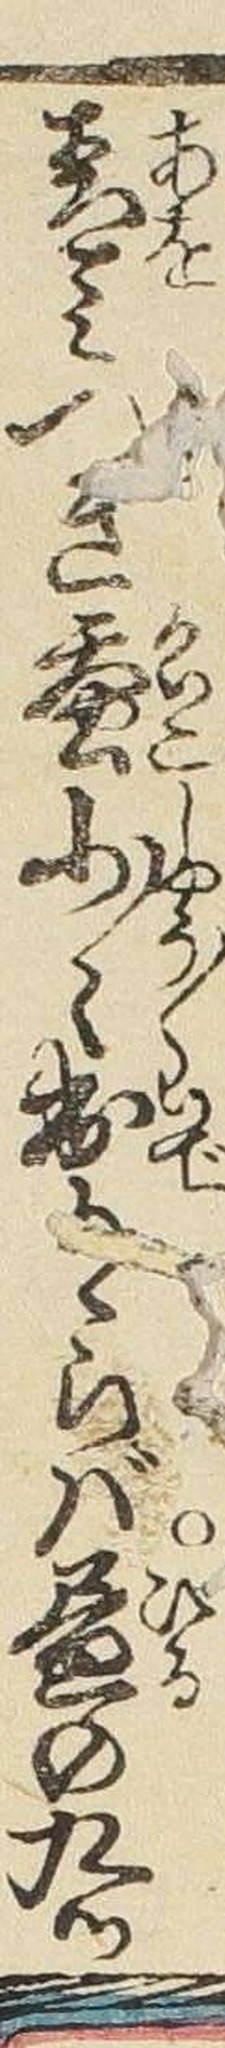青みつき蚕少々出かゝらば。昼の九ッ
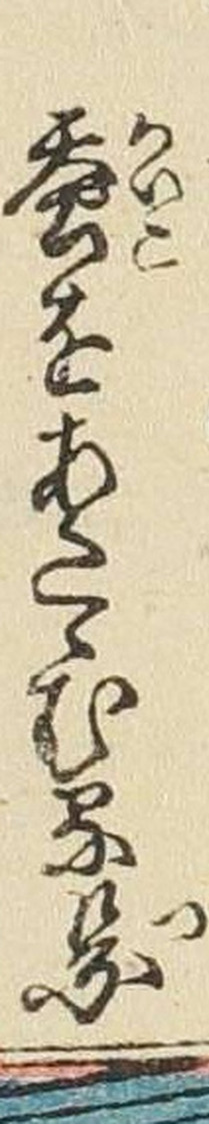蚕をあたゝむる図
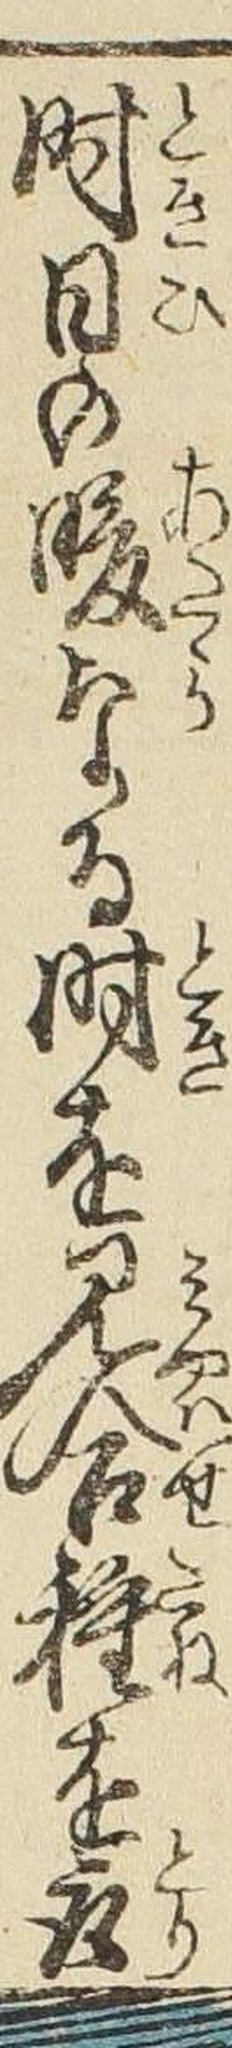時日の暖なる時を見合種を取
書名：養蠶圖解
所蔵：東京大学農学生命科学図書館 国文学研究資料館
